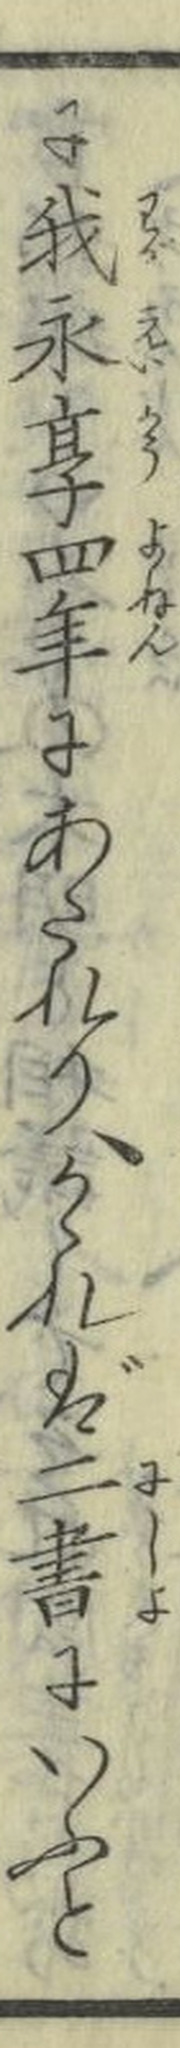に我永享四年にあたれり、かゝれば二書にいふと
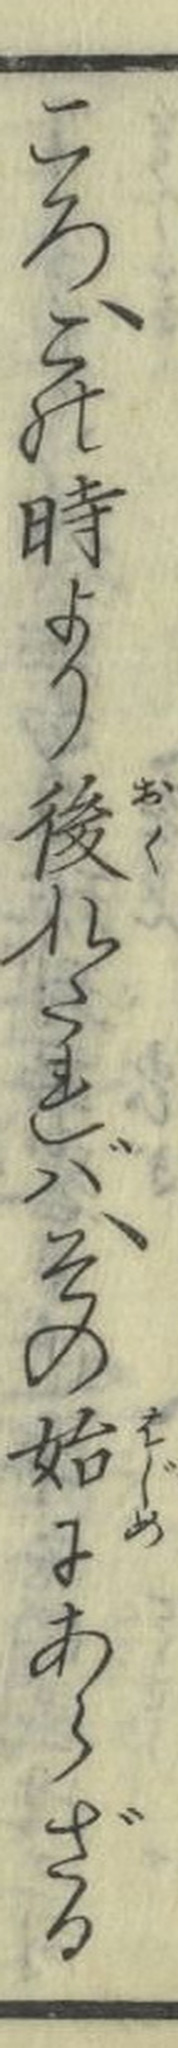ころ、この時より後れたれば、その始にあらざる
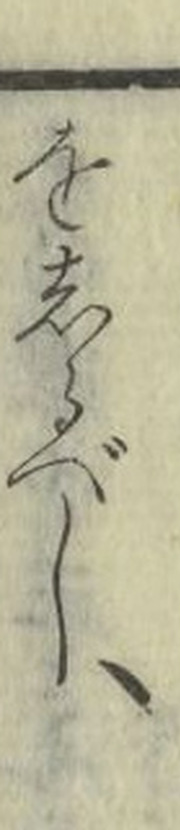をしるべし、
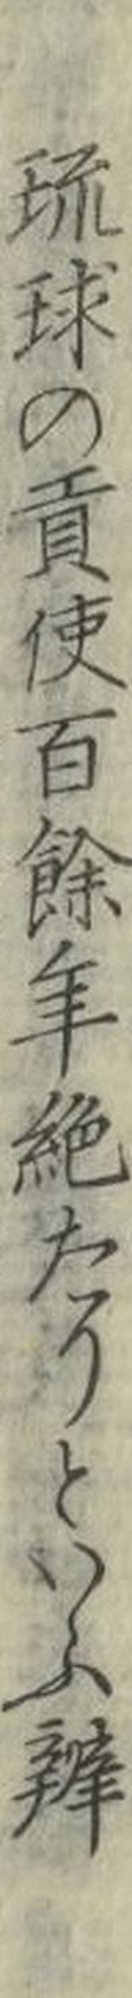琉球の貢使百余年絶たりといふ弁
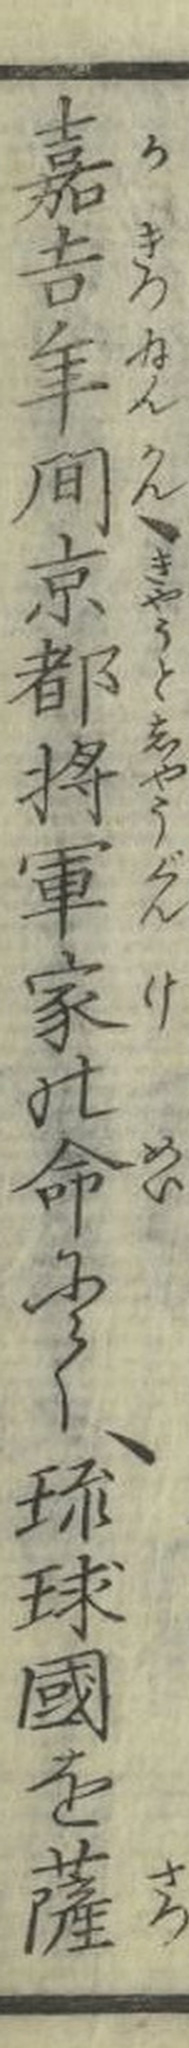嘉吉年間、京都将軍家の命にて、琉球国を薩

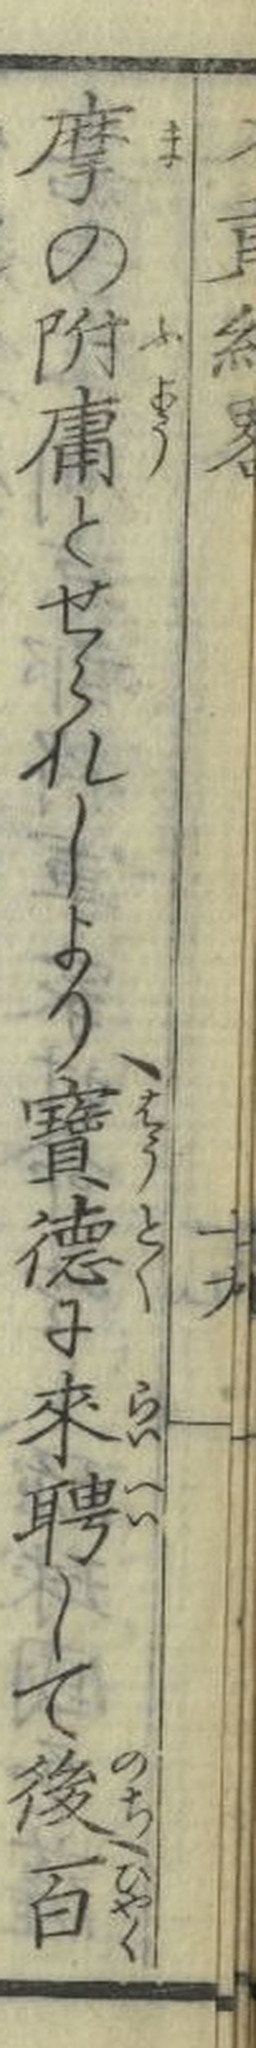摩の附庸とせられしより、宝徳に来聘して後、百
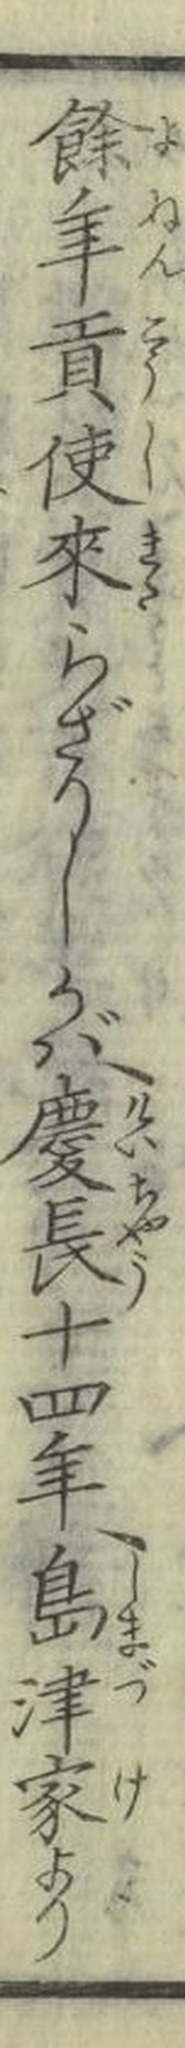余年貢使来らざりしかば、慶長十四年、島津家より
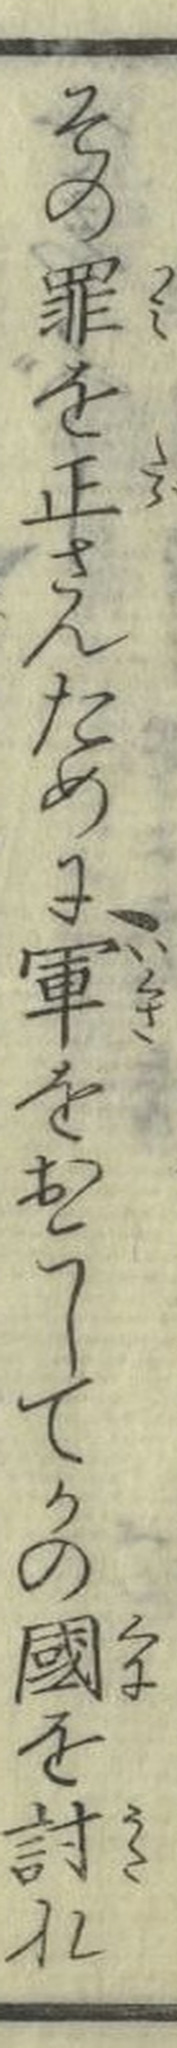その罪を正さんために、軍をおこしてかの国を討れ
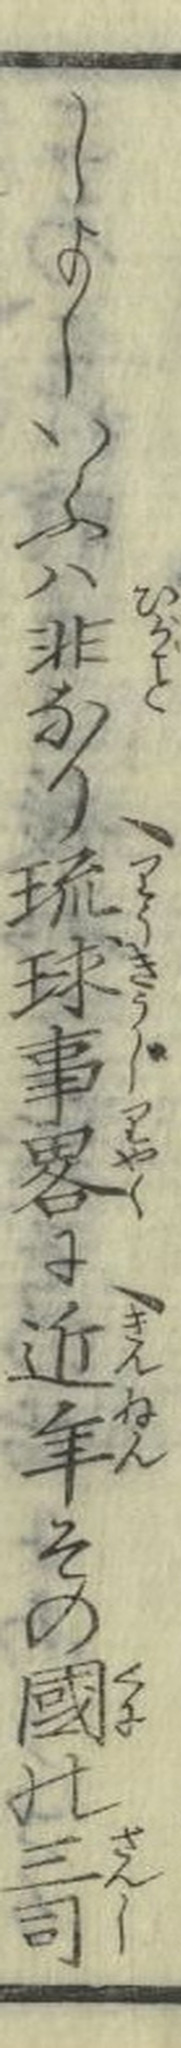しよしいふは非なり、琉球事略に、近年その国の三司
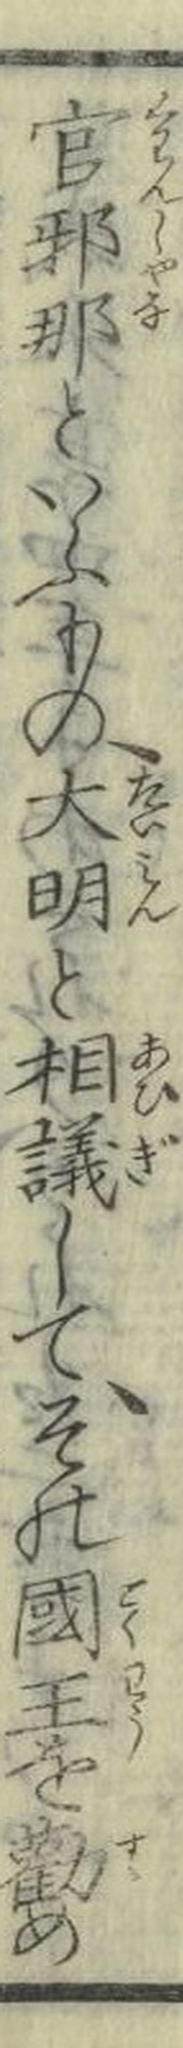官邪那といふもの、大明と相議して、その国王を勧め
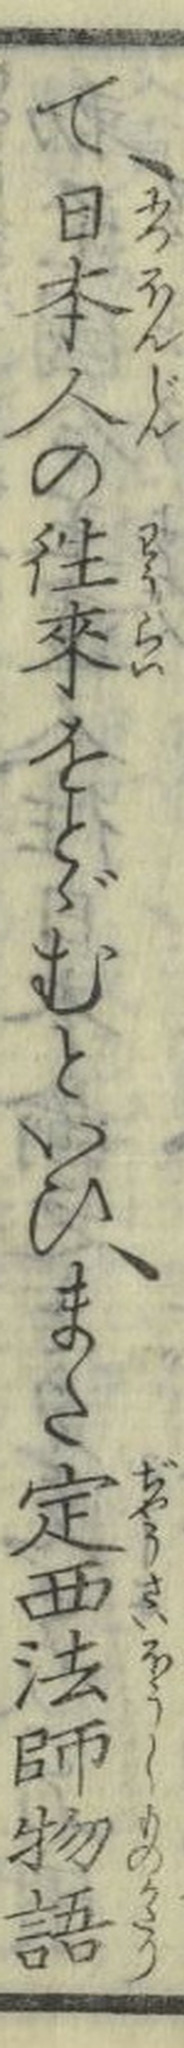て、日本人の往来をとゞむといひ、また定西法師物語
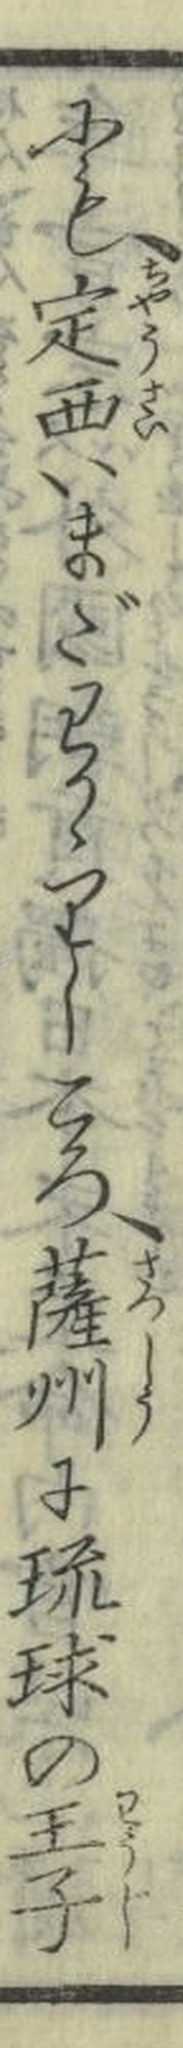にも、定西いまだわかゝりしころ、薩州に琉球の王子
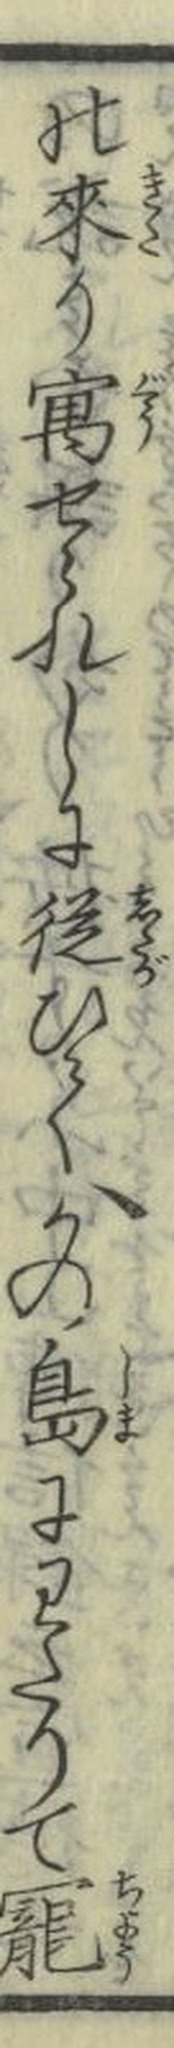の来り寓せられしに従ひて、かの島にわたりて寵
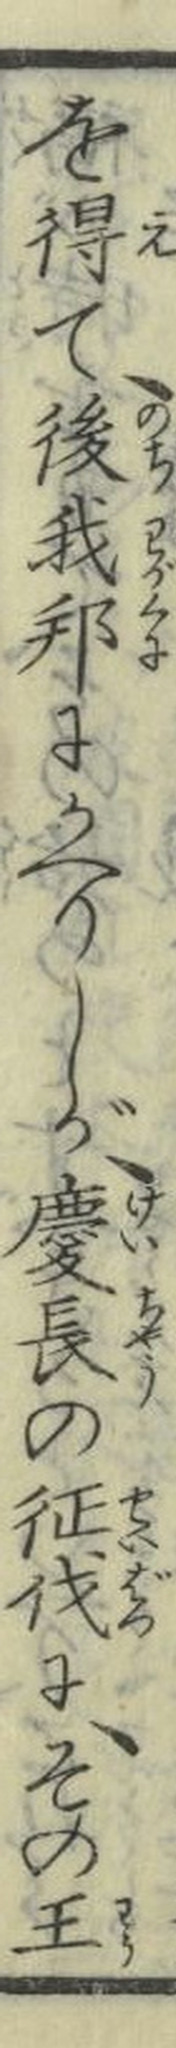を得て、後我邦にかへりしが、慶長の征伐に、その王
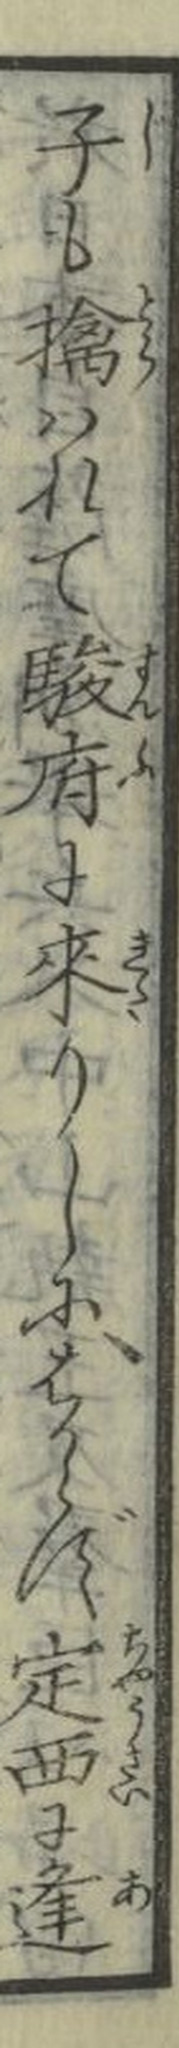子も擒はれて駿府に来りしに、はからず定西に逢
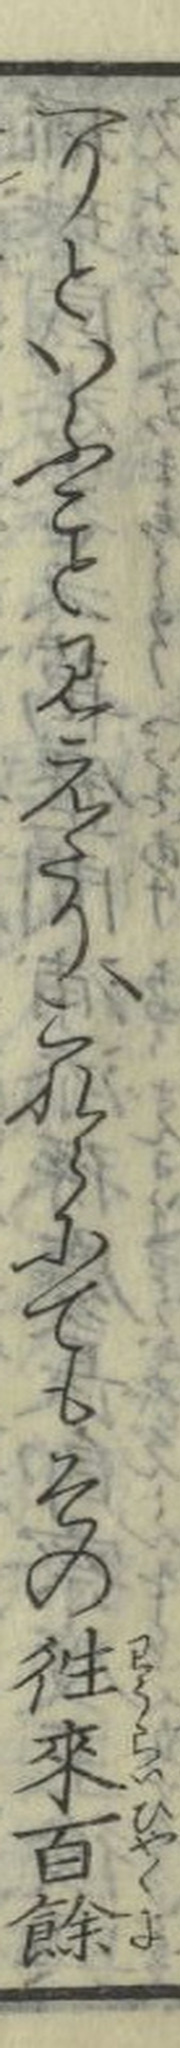へりといふこと見えたり、これらにてもその往来百余
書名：琉球入貢紀畧
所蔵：University of the Ryukyus Library
